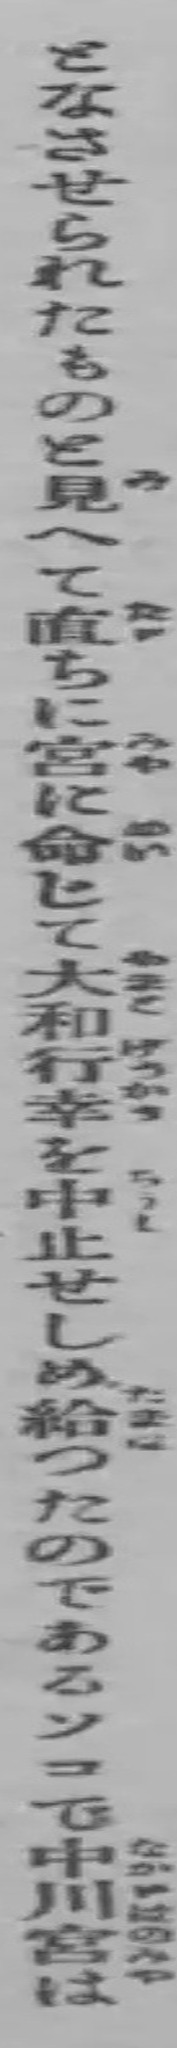となさせられたものと見へて直ちに宮に命じて大和行幸を中止せしめ給つたのであるソコで中川宮は
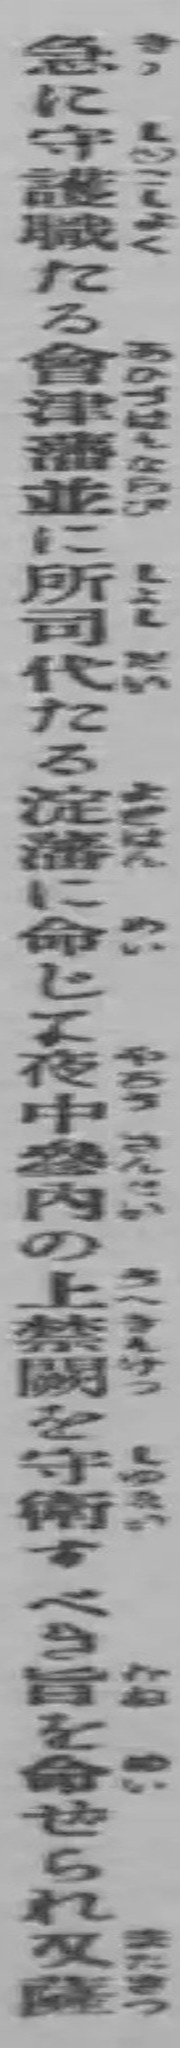急に守護職たる会津藩並に所司代たる淀藩に命じて夜中参内の上禁闕を守衛すべき旨を命ぜられ又薩
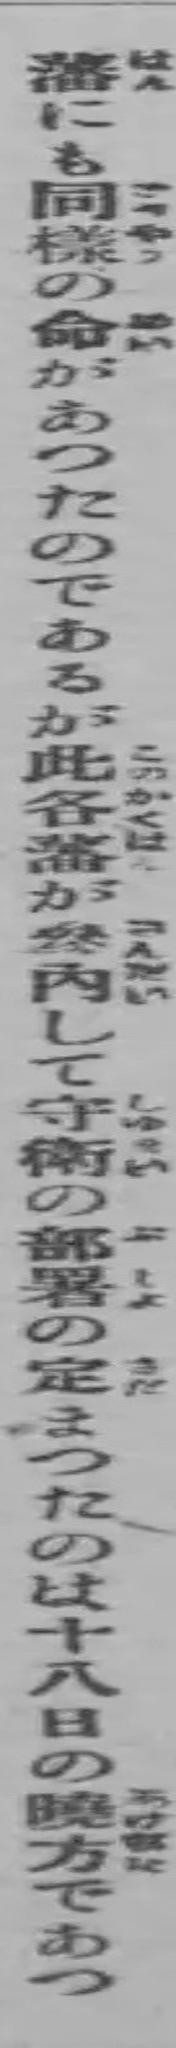藩にも同様の命があつたのであるが此各藩が参内して守衛の部署の定まつたのは十八日の暁方であつ
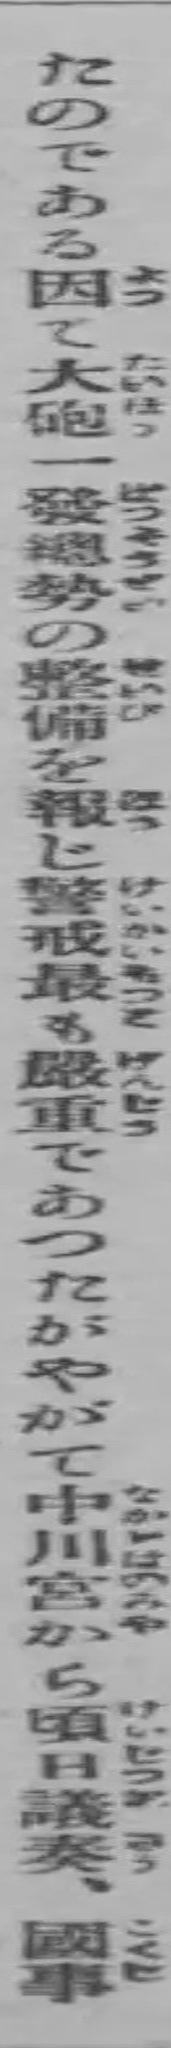たのである因て大砲一発総勢の整備を報じ警戒最も厳重であつたがやがて中川宮から頃日議奏、国事
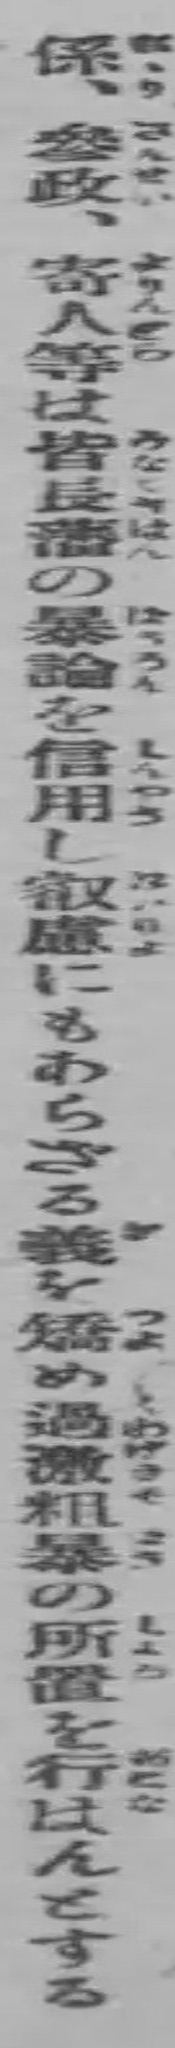係、参政、寄人等は皆長藩の暴論を信用し叡慮にもあらざる義を矯め過激粗暴の所置を行はんとする
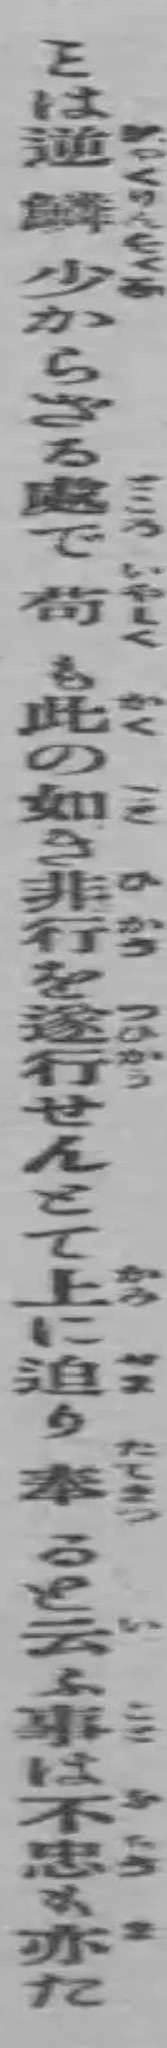ことは逆鱗少からざる処で苟も此の如き非行を遂行せんとて上に迫り奉つと云ふ事は不忠も亦た
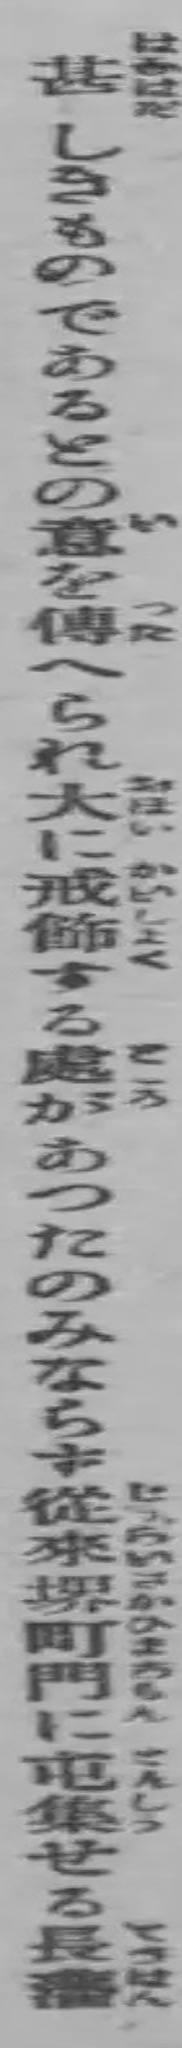甚しきものであるとの意を伝へられ大に戒飾する処があつたのみならず従来堺町門に屯集せる長藩
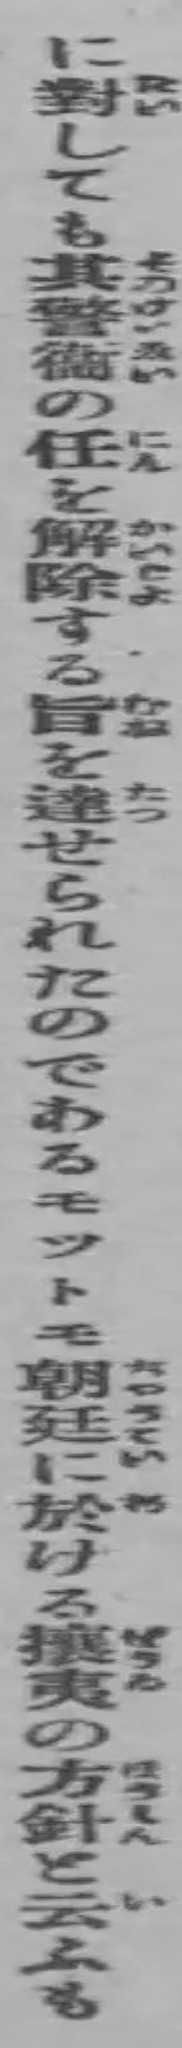に対しても其警衛の任を解除する旨を達せられたのであるモツトモ朝廷に於ける攘夷の方針と云ふも
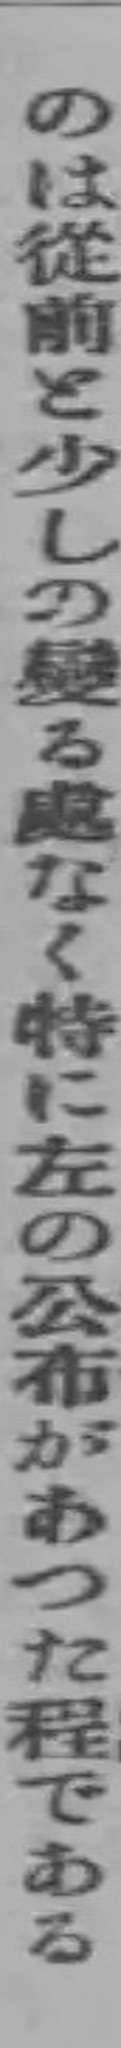のは従前と少しの変る処なく特に左の公布があつた程である

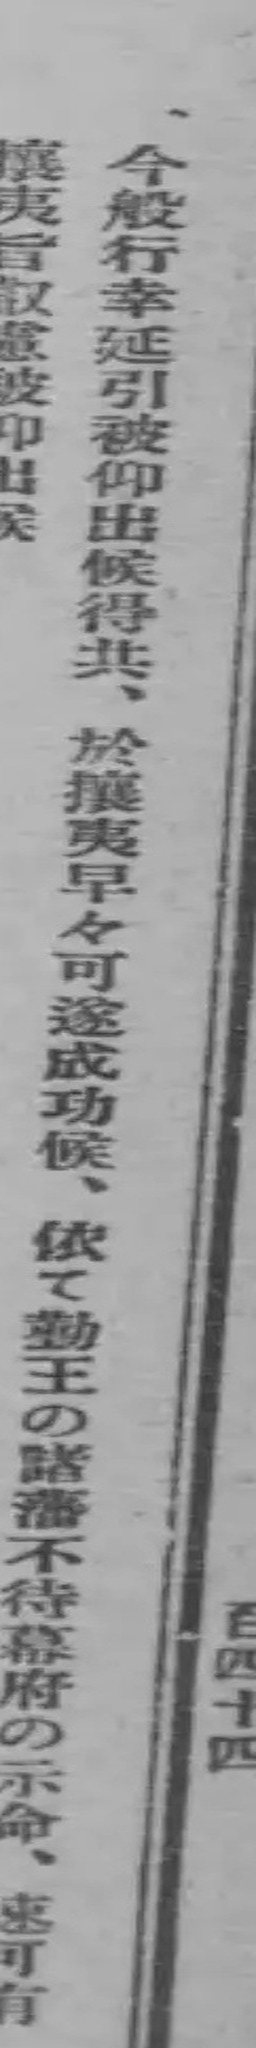今般行幸延引被仰出候得共、於攘夷早々可遂成功候、依て勤王の緒藩不待幕府の示命、速可有
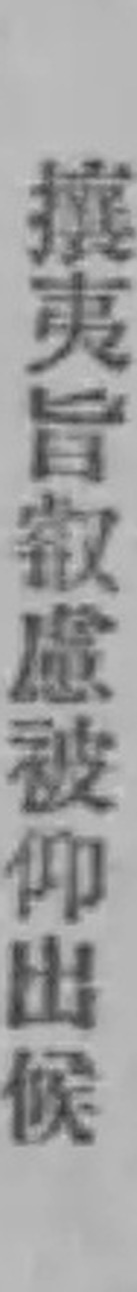攘夷旨叡慮被仰出候
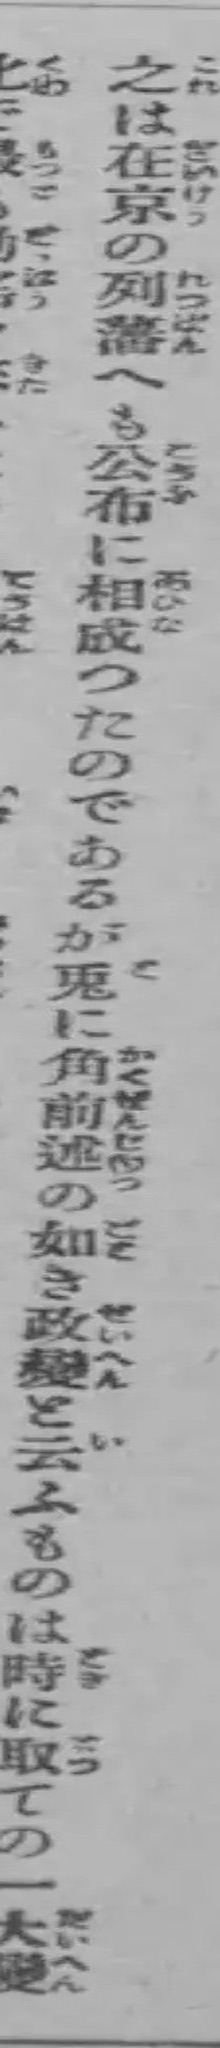之は在京の列藩へも公布に相成つたのであるが兎に角前述の如き政変と云ふものは時に取ての一大変
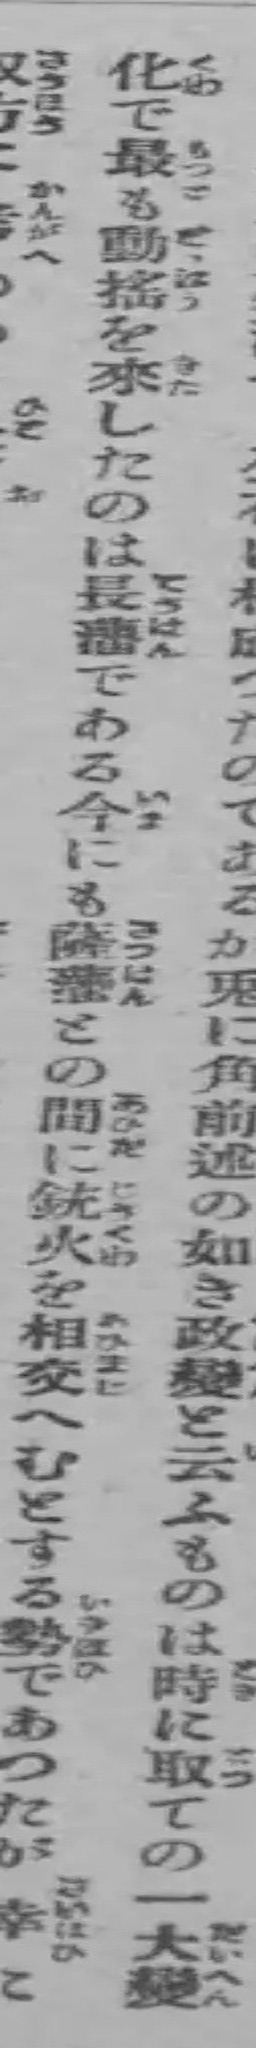化で最も動揺を来したのは長藩である今にも薩藩との間に銃火を相交へむとする勢であつたが幸に
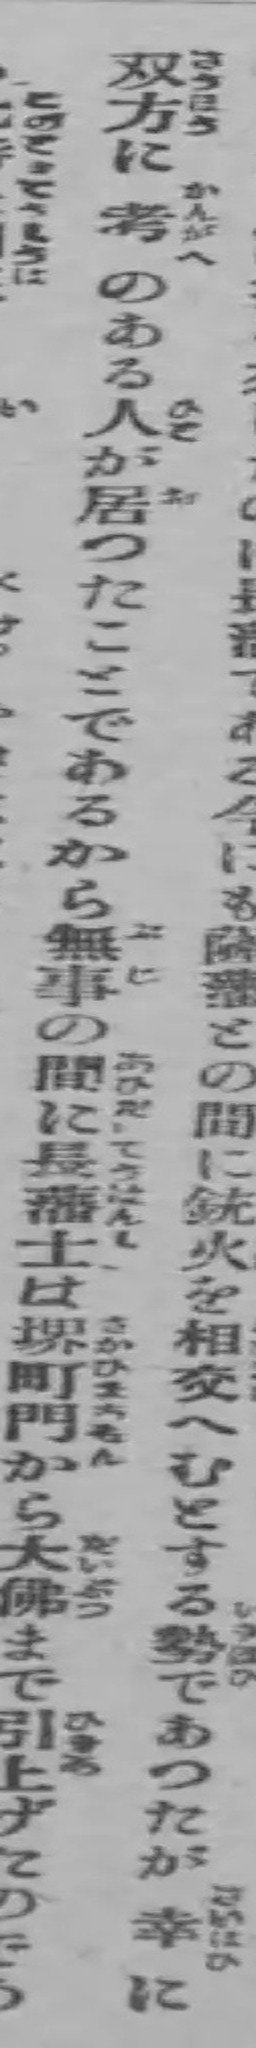双方に考のある人が居つたことであるから無事の間に長藩士は堺町門から大仏まで引上げたのであ
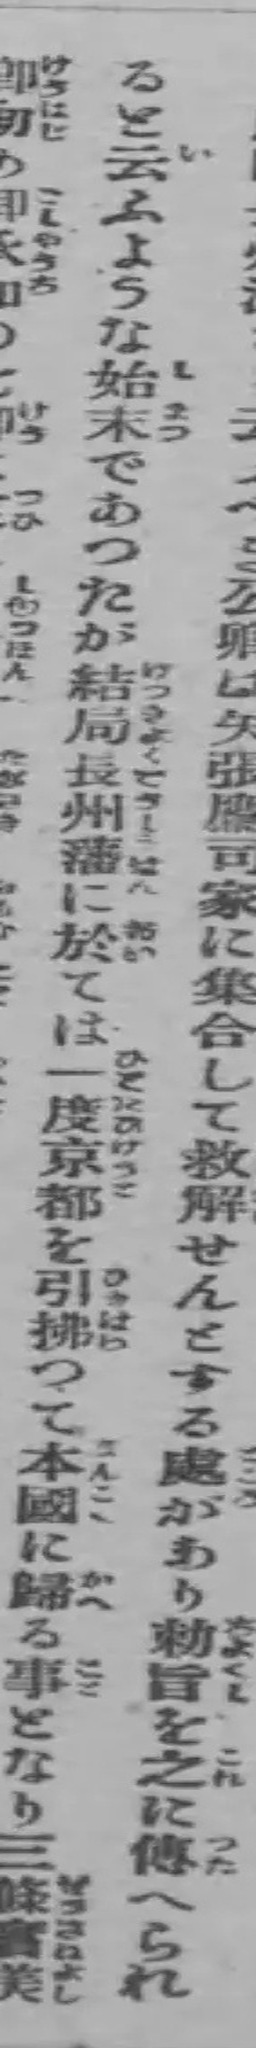ると云ふような始末であつたが結局長州藩に於ては一度京都を引払つて本国に帰る事となり三條実美
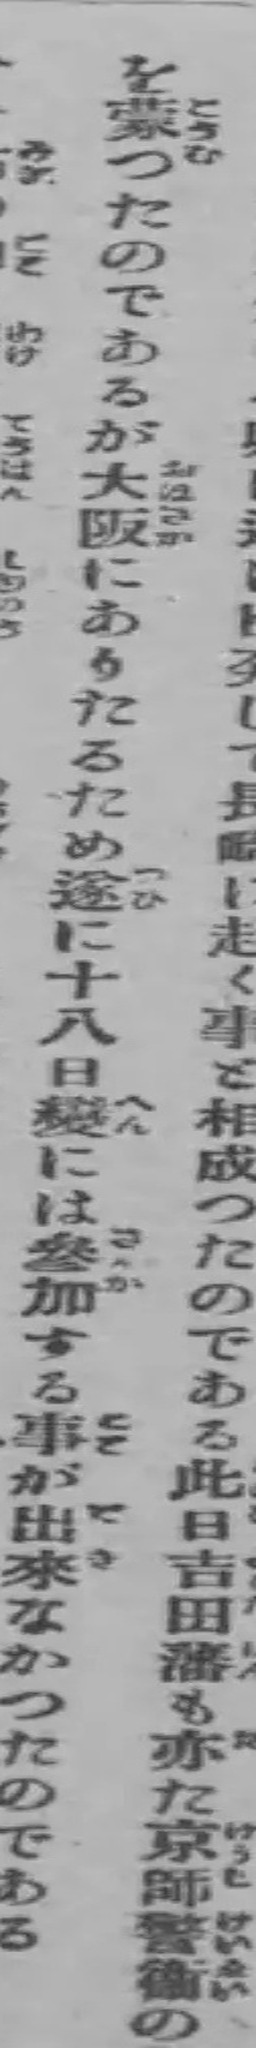を蒙つたのであるが大阪にありたるため遂に十八日変には参加する事が出来なかつたのである
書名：豊橋市史談
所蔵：国立国会図書館 National Diet Library, JAPAN
